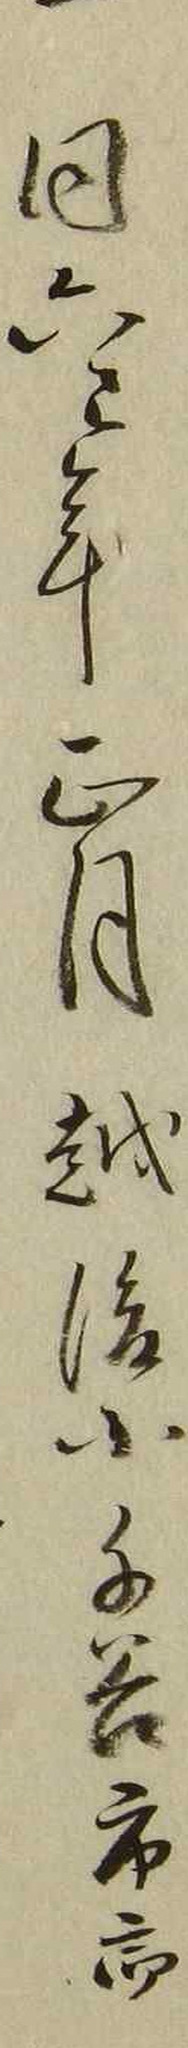一同六已年正月越後小千谷市郎
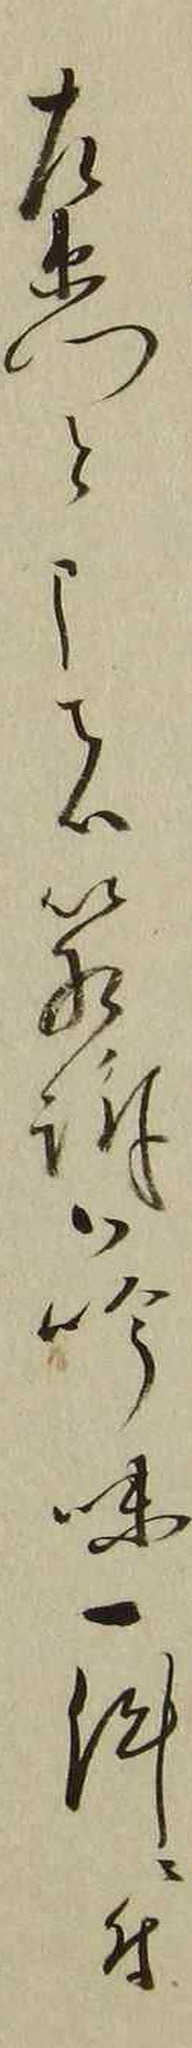左衛門と申者箱訴御吟味一件ニ付
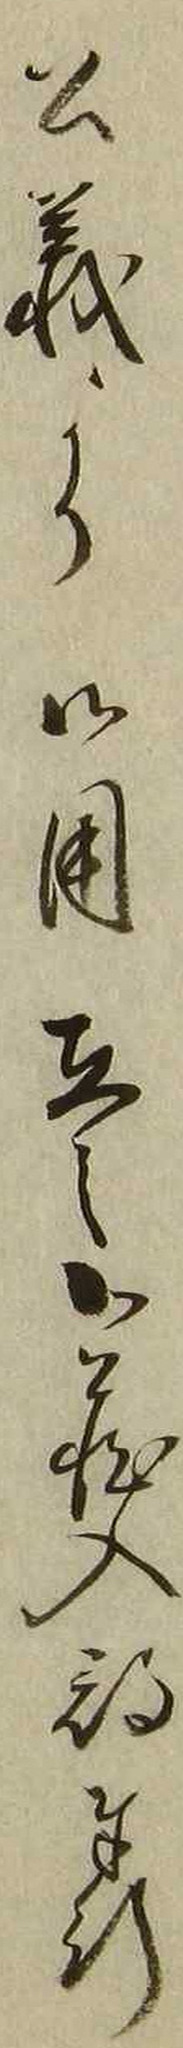公義より御用在之御蔵入郡奉行
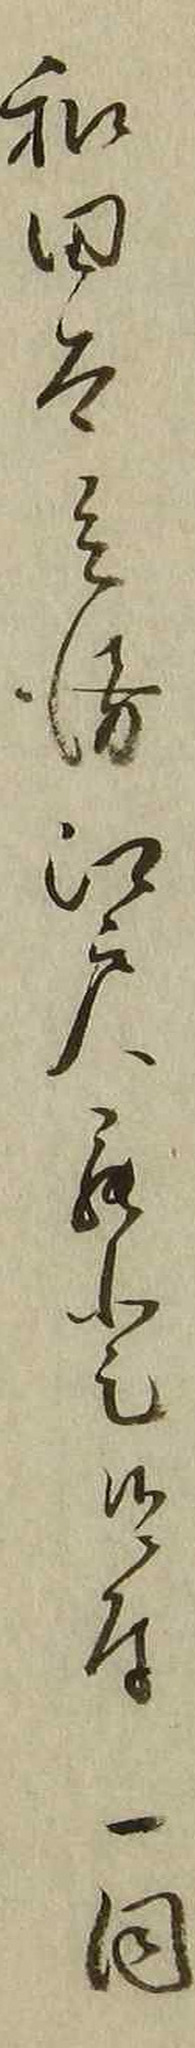和田太兵衛江戸へ罷登候ニ付一同
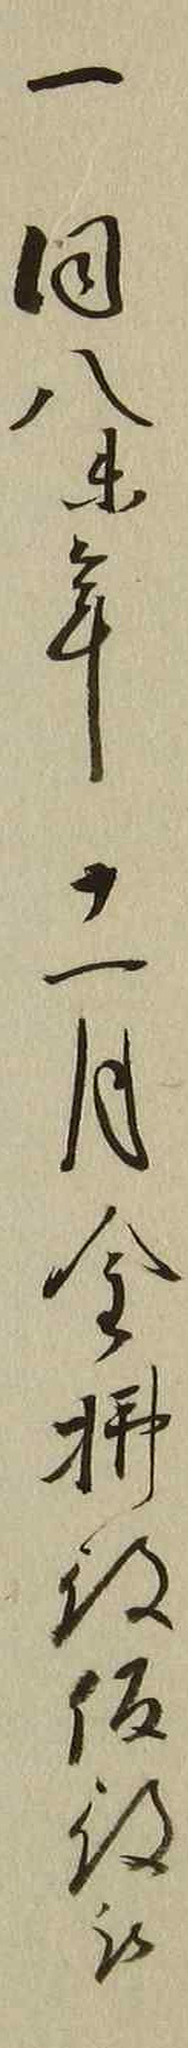一同八未年十一月金払役仮役被
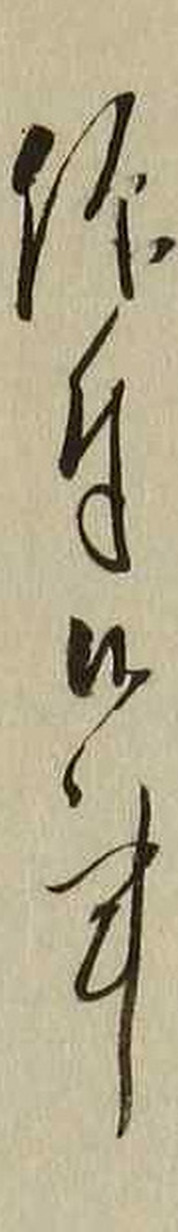仰付候事
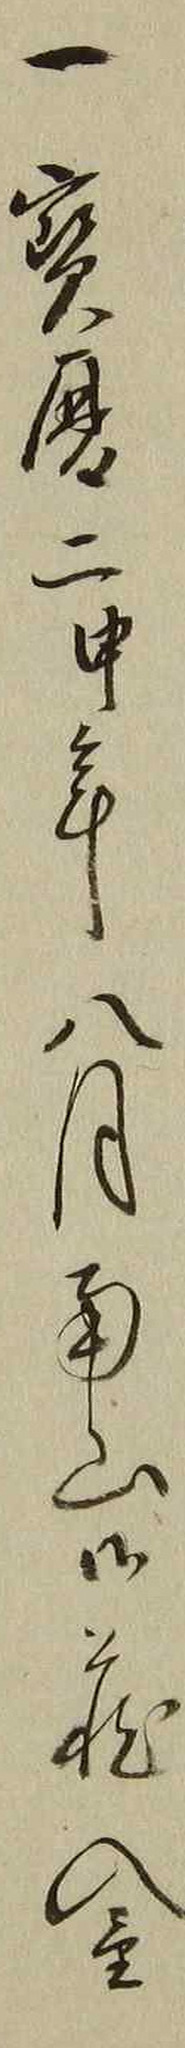一宝暦二申年八月南山御蔵入金
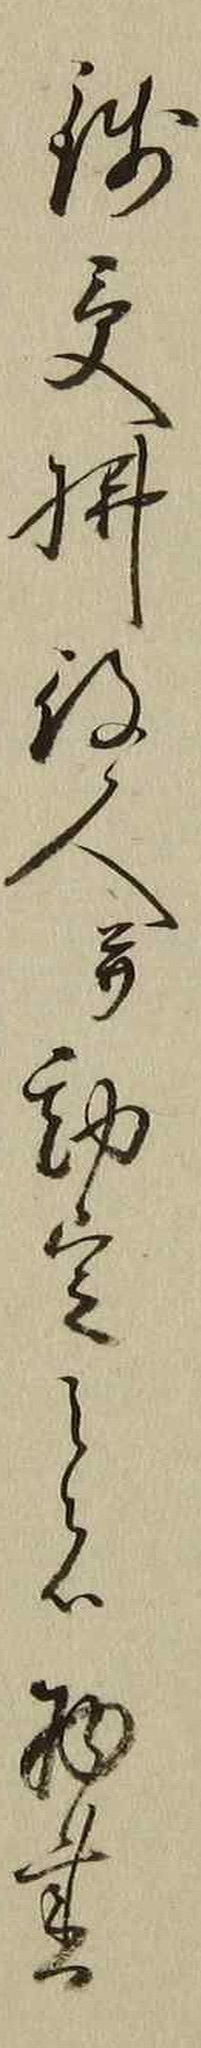銭受払役人并勘定之者物書
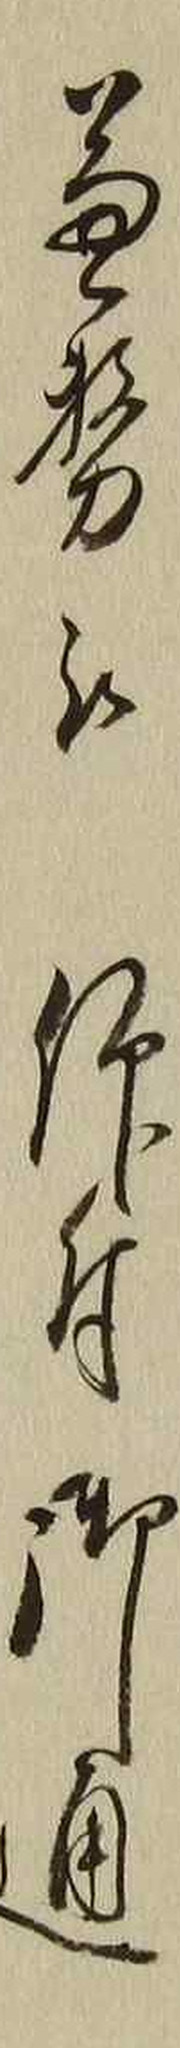兼務被仰付御通
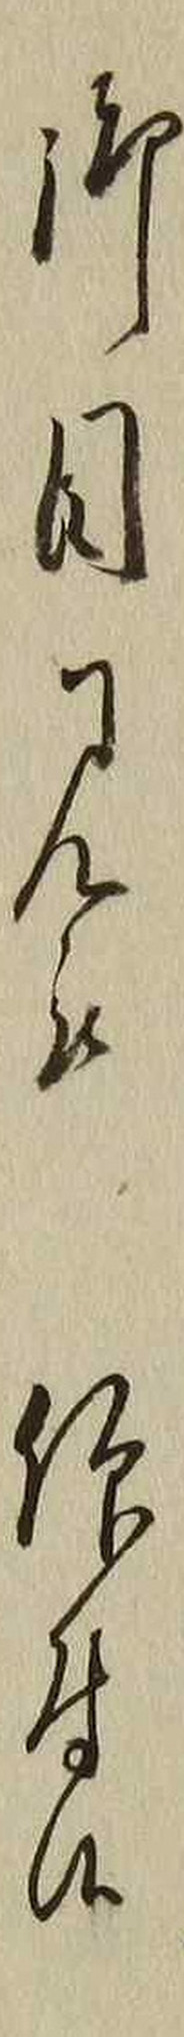御目見被仰付候
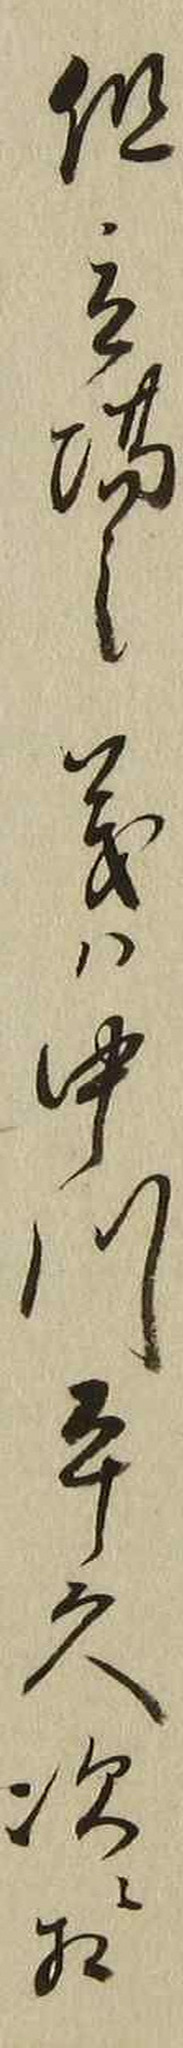但立場之義ハ中川平久次ニ相
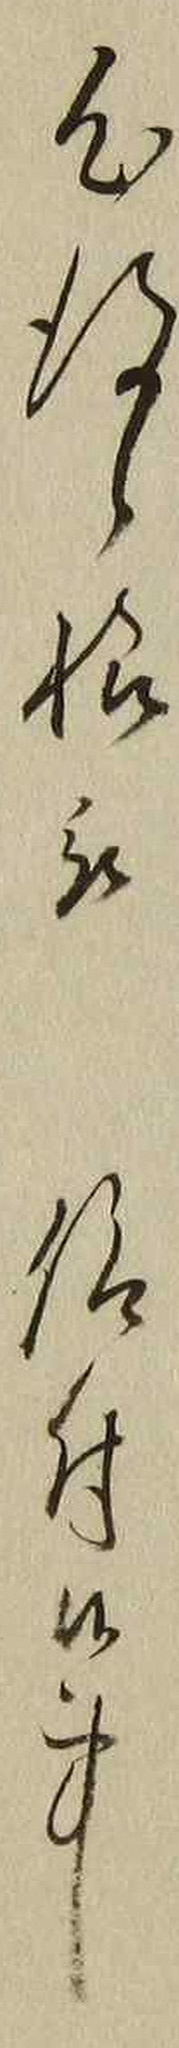心得候様被仰付候事
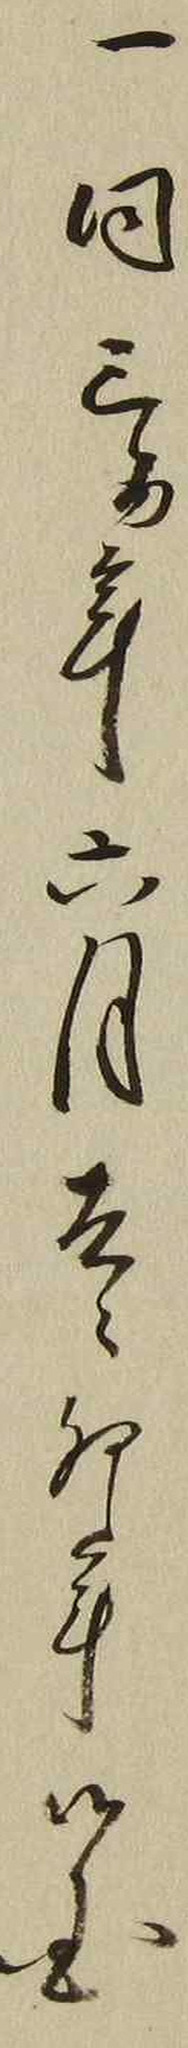一同三酉年六月去々卯年御国
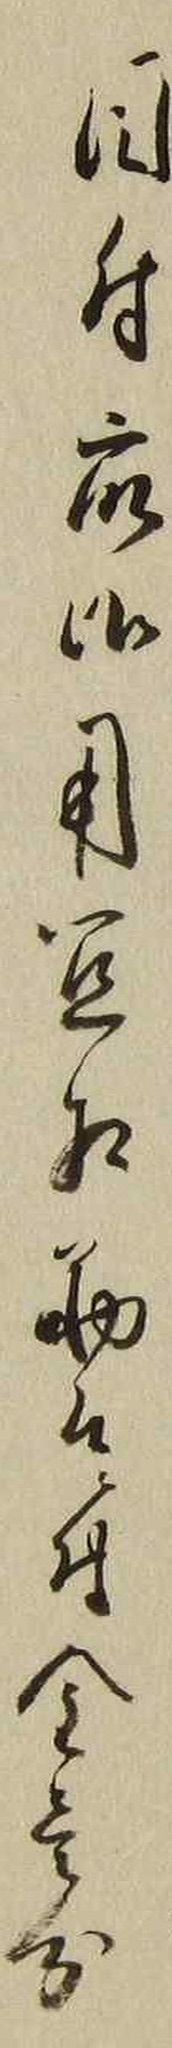目付衆御用宜相勤候ニ付金壱分
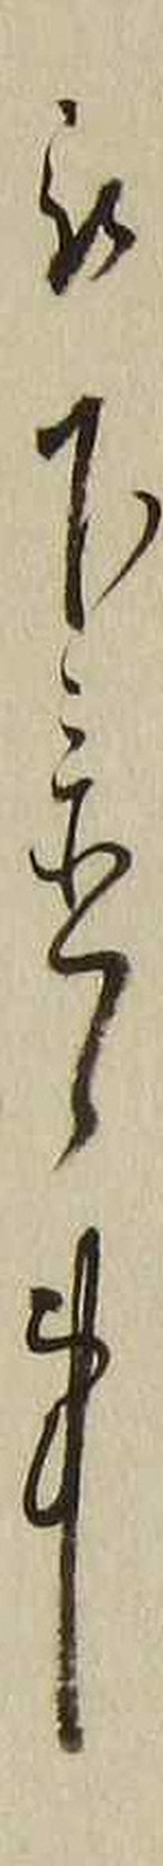被下置候事
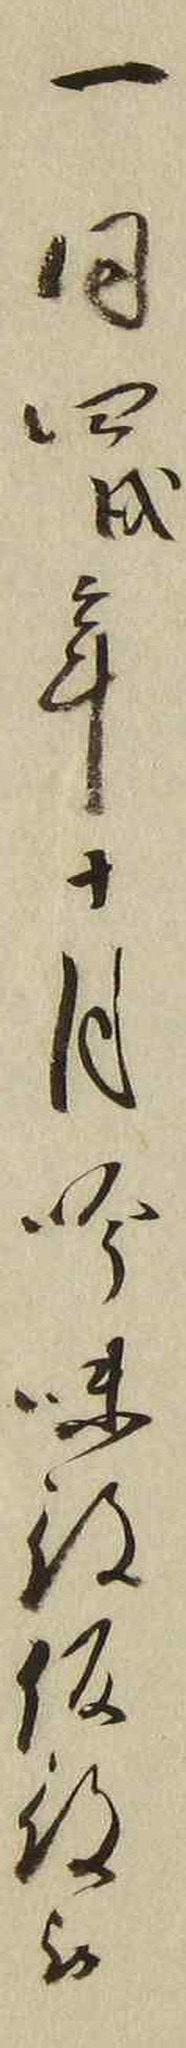一同四戌年十月吟味役仮役被
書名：諸士系譜　巻之132　た之部8
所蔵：会津若松市立会津図書館
